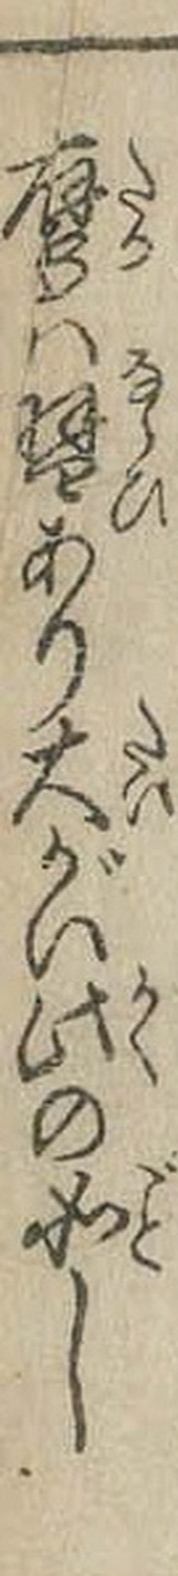鷹は習あり大がい此の如し

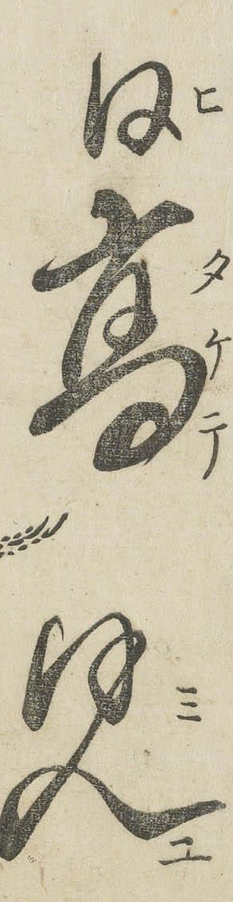日高見
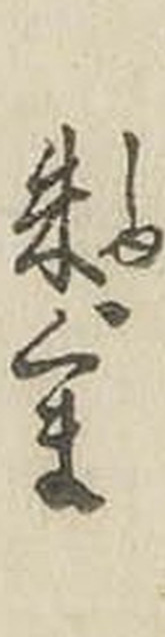朱ぐま

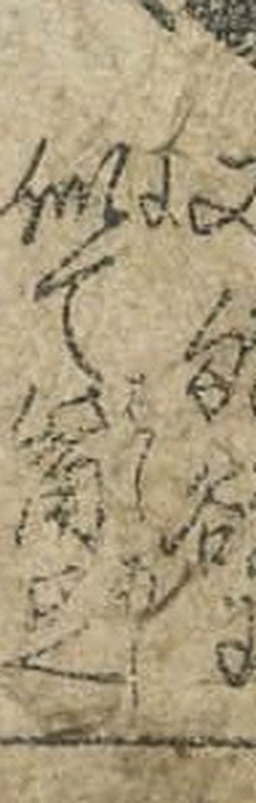似て觜足
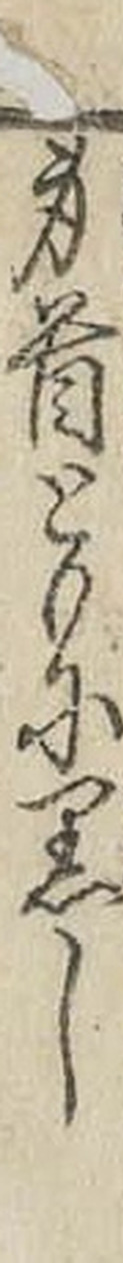身首ともに黒し
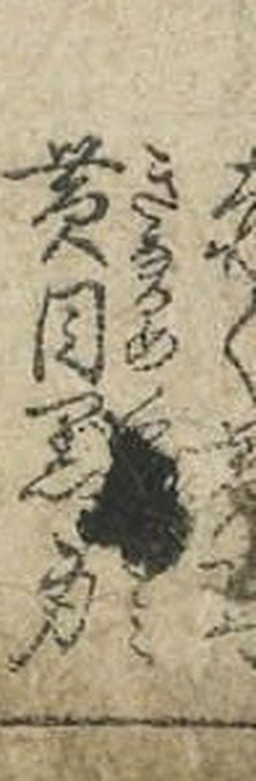黄目黒身
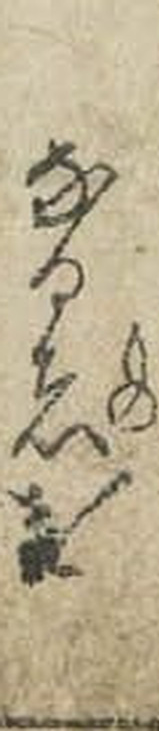なる者を
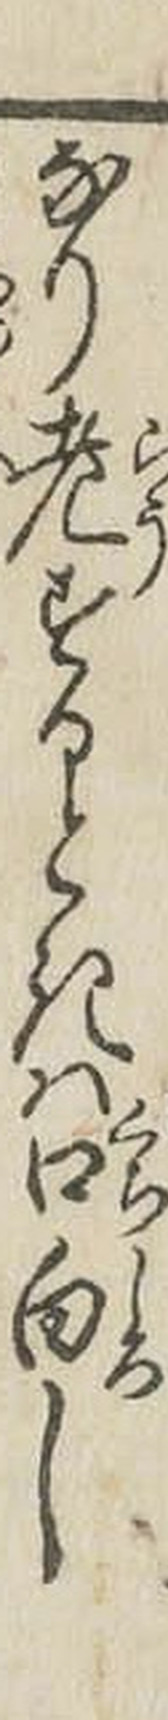なり老するときは口白し
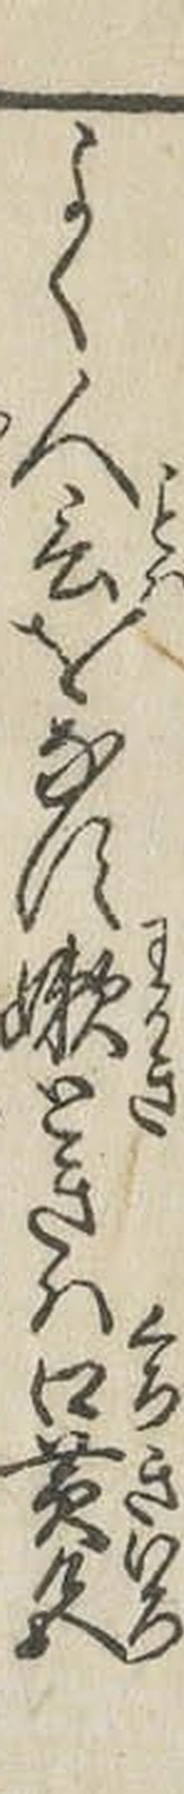よく人言をなす嫩ときは口黄色
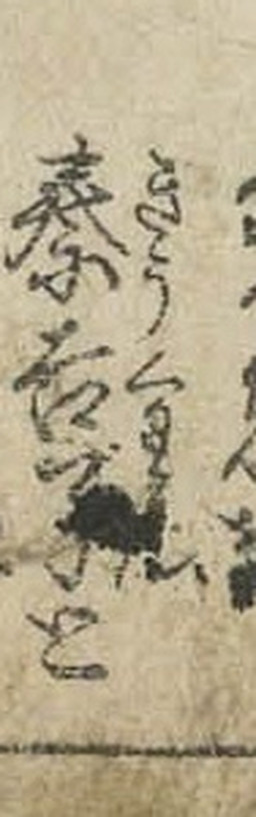秦吉了と
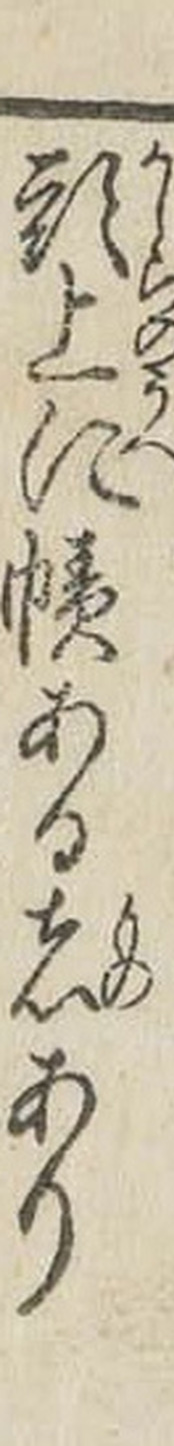頭上に幘ある者あり
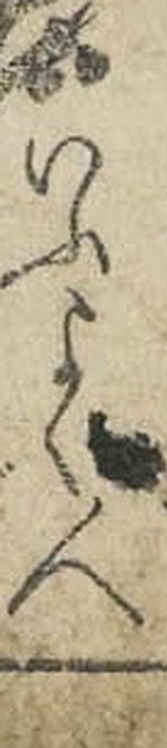いふよく人
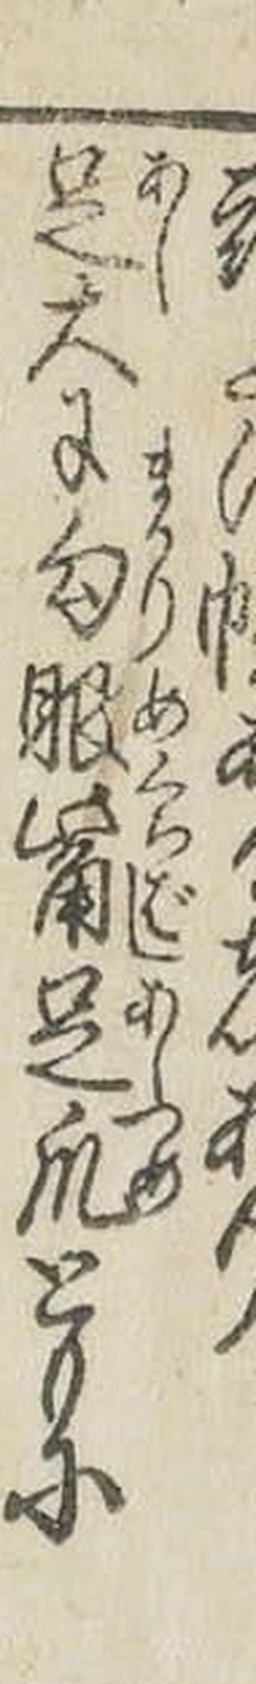足大に勾眼觜足爪ともに
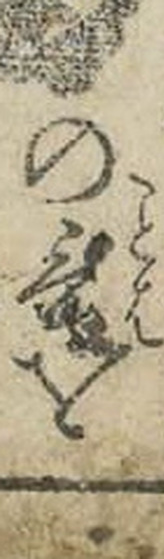の言を
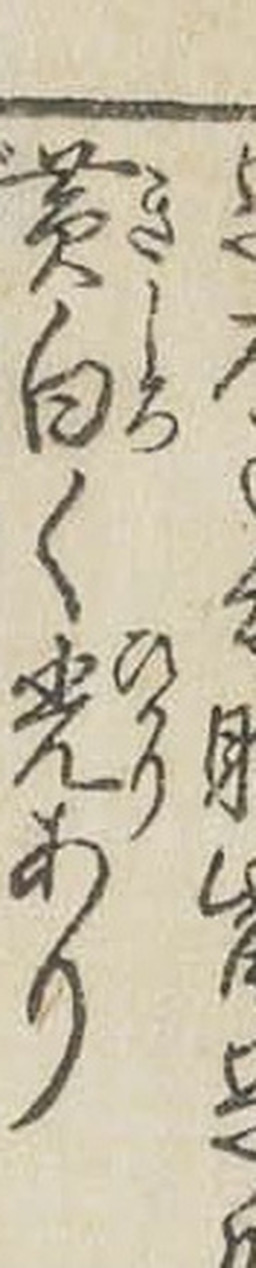黄白く光あり
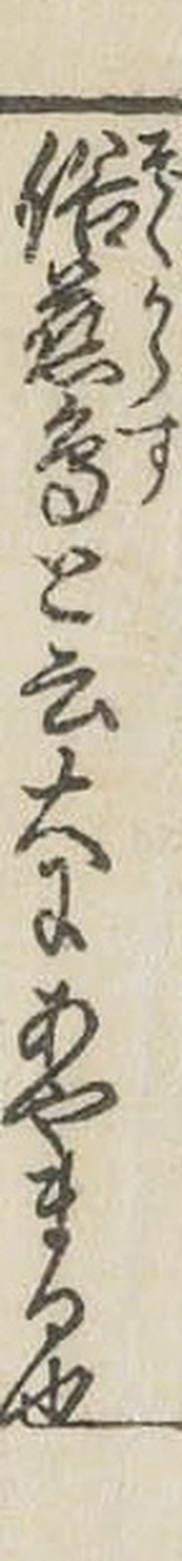俗慈烏と云大にあやまる也
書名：絵本写宝袋 9巻 8之巻
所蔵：東京学芸大学教育コンテンツアーカイブ
